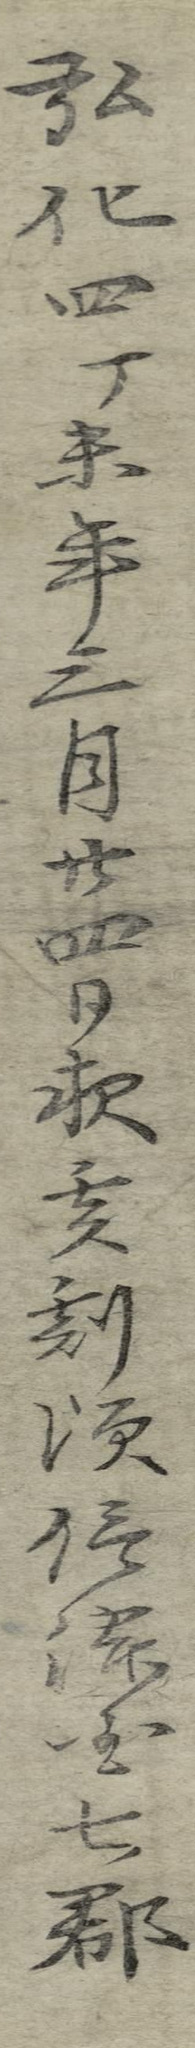弘化四丁未年三月廿四日夜亥刻頃信濃国七郡
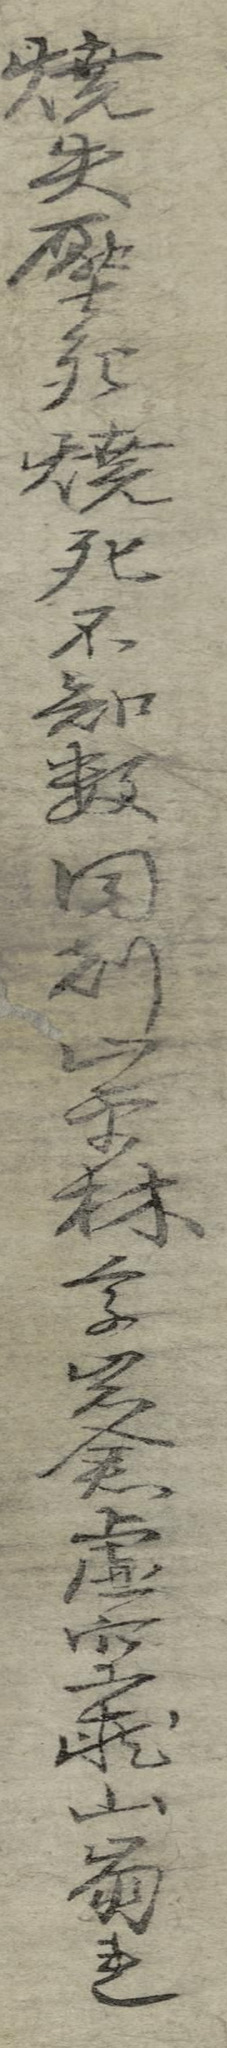焼失圧死焼死不知数同刻山平林字岩倉虚空蔵山崩れ
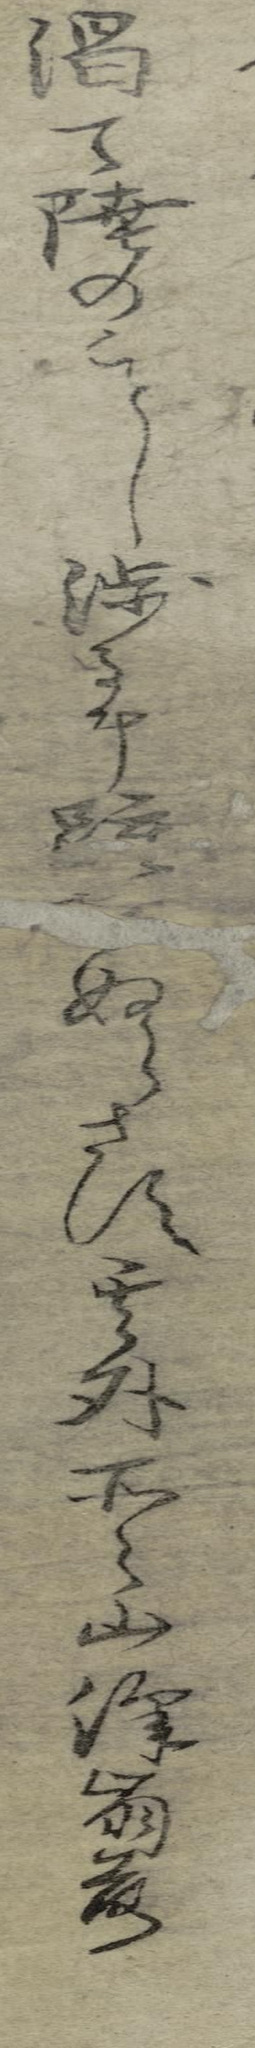涸て陸のことし渉るに跡をぬらさす其外所々山崩落
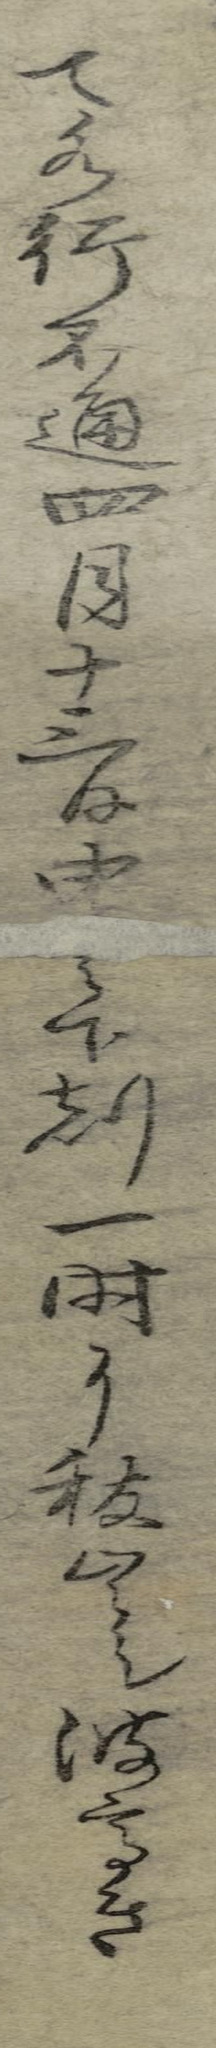て水行不通四月十三日申之下刻一時に抜出し波高き
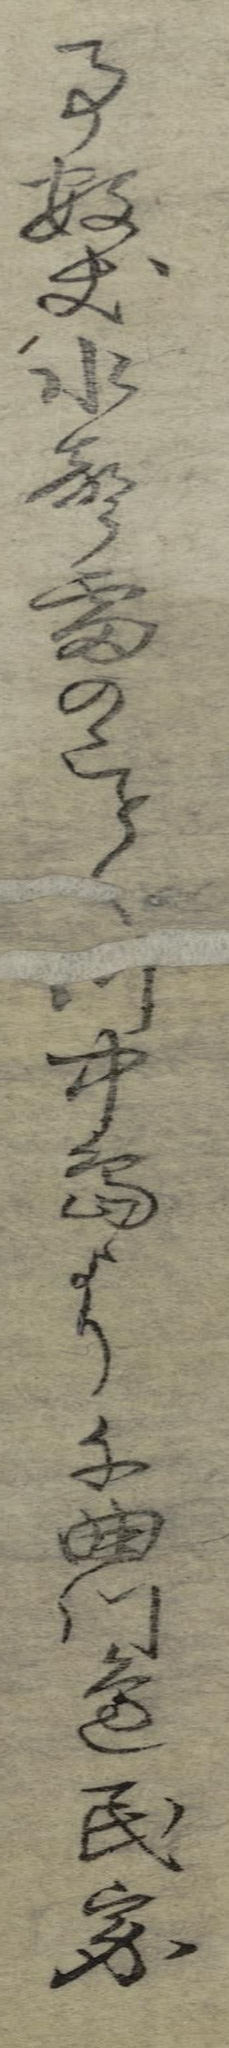事数丈水蒙り雷のことく川中嶋より千曲川辺民家
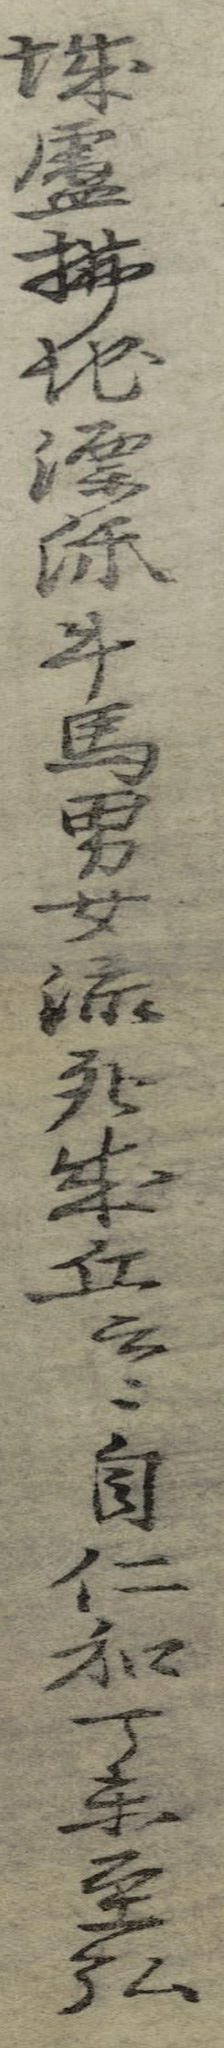城蘆地漂流牛馬男女流死成丘云二自仁和丁未至弘
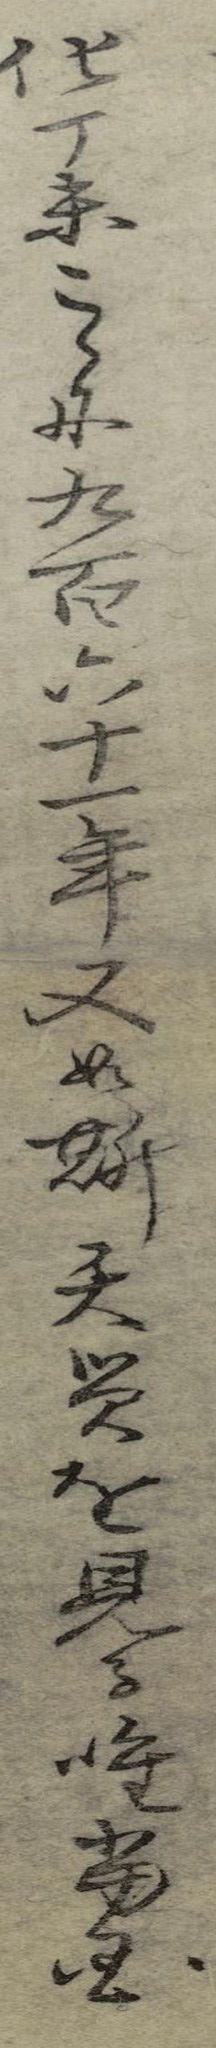化丁未こゝに九百六十一年又如斯天災を見る唯当国
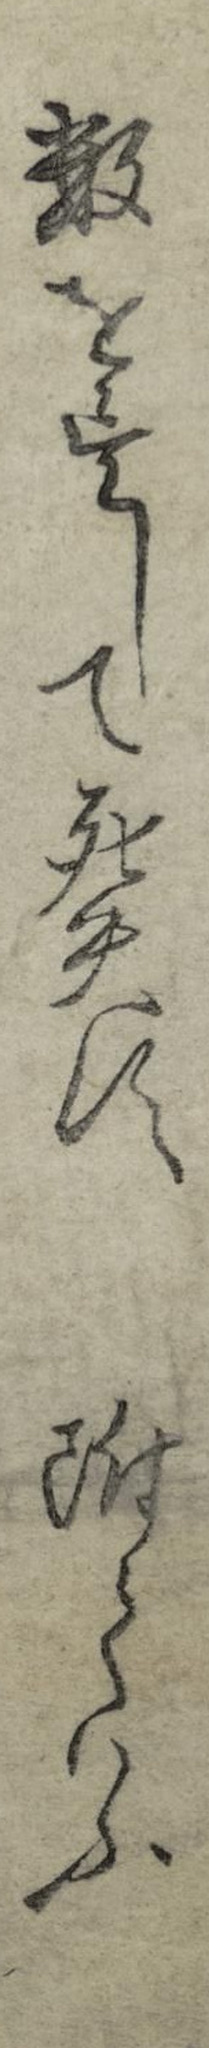数をすて死失す附ていふ
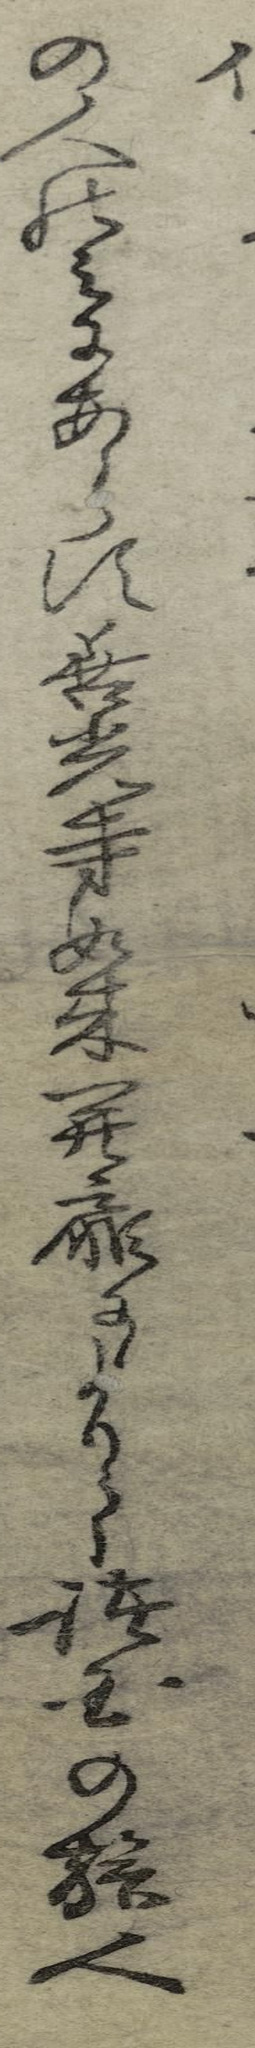の人のミにあらす善光寺如来開廰により諸国の旅人
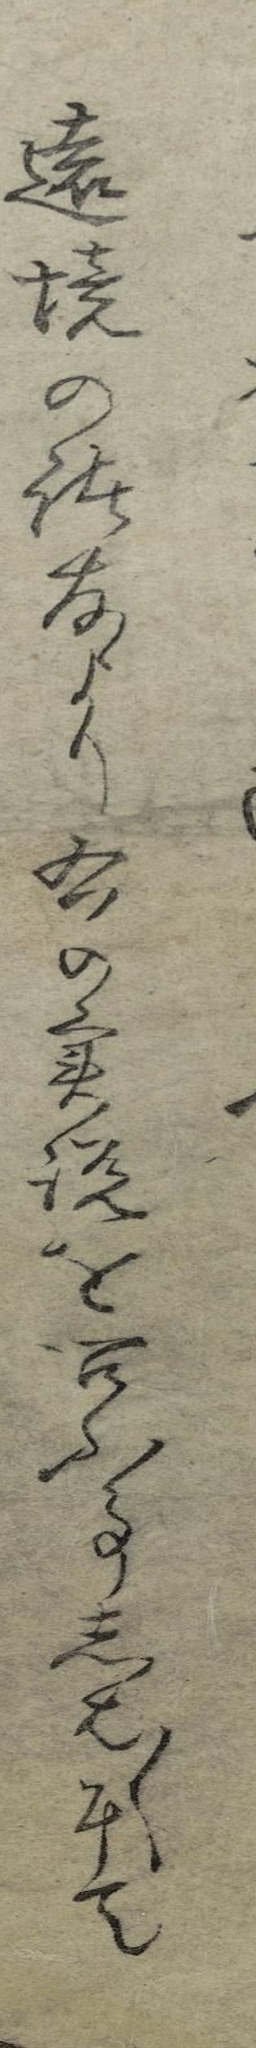遠境の諸友より右の実説を問ふ事しは〳〵にて
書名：[善光寺地震に関する瓦版]
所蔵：東京大学地震研究所図書室 Earthquake Research Institute Library, The University of Tokyo, JAPAN
